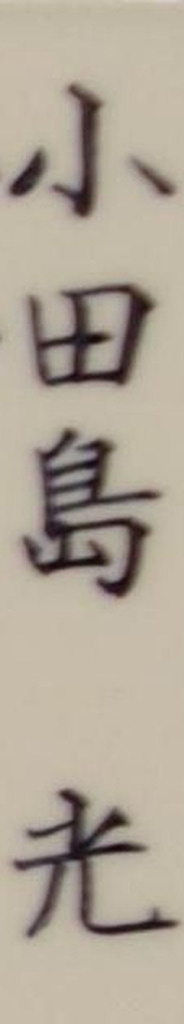小田島光
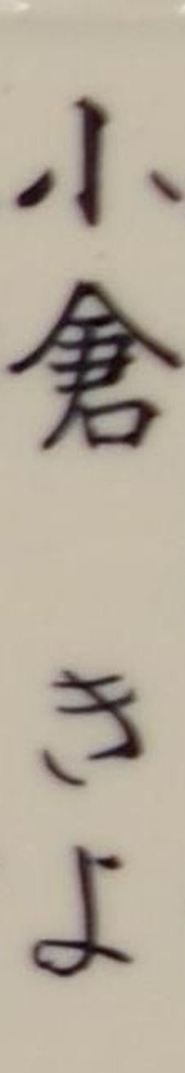小倉きよ
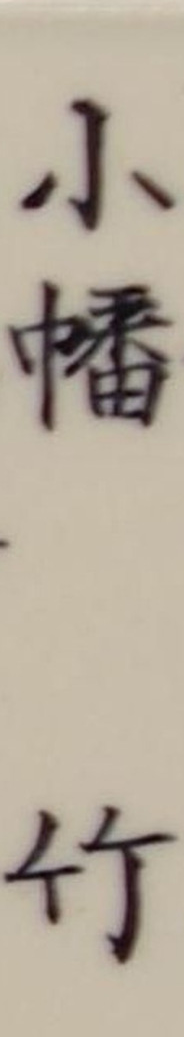小幡竹
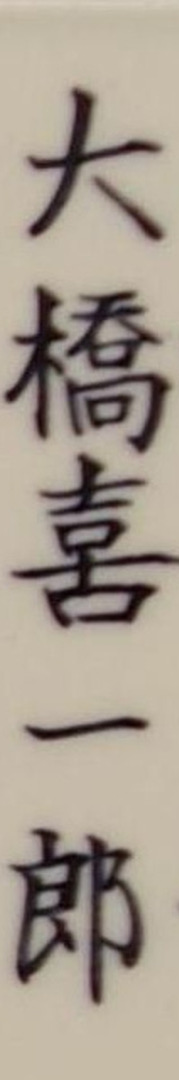大橋喜一郎
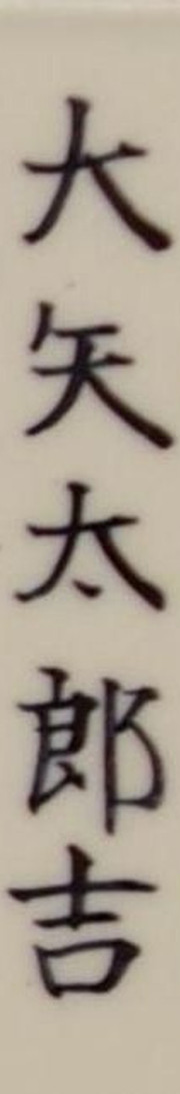大矢太郎吉
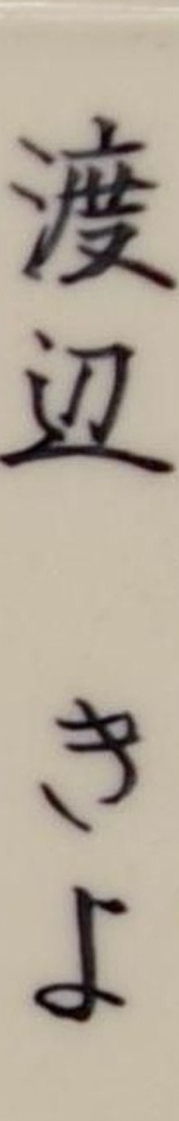渡辺きよ
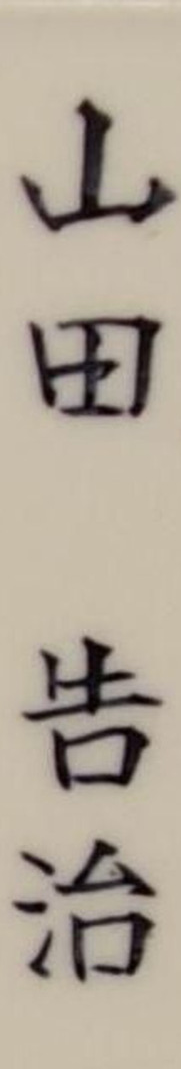山田告治
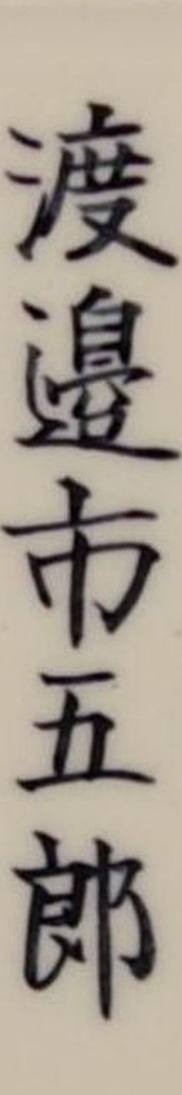渡邉市五郎
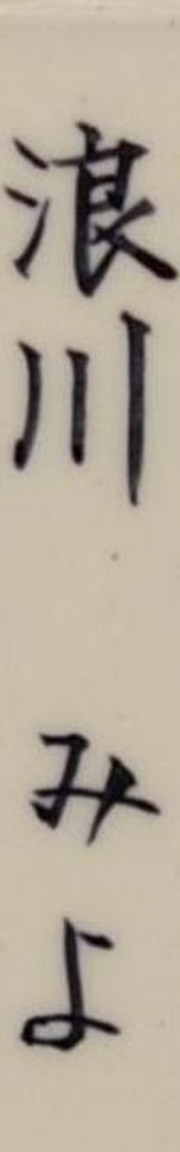浪川みよ
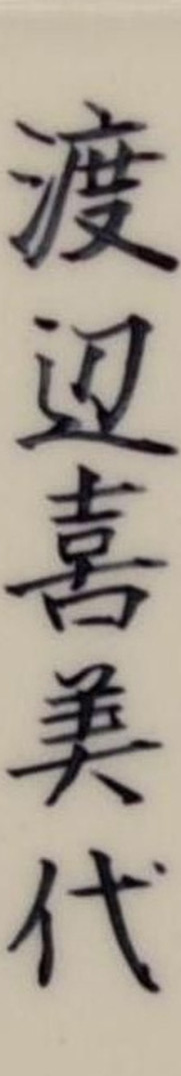渡辺喜美代
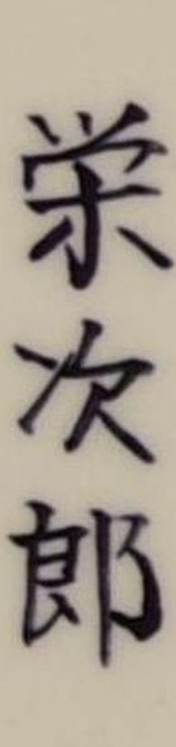栄次郎
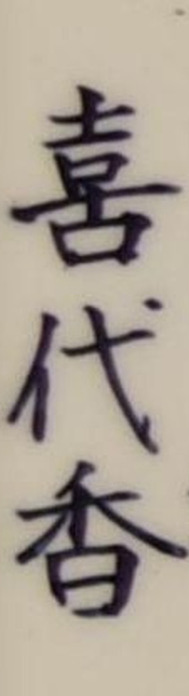喜代香

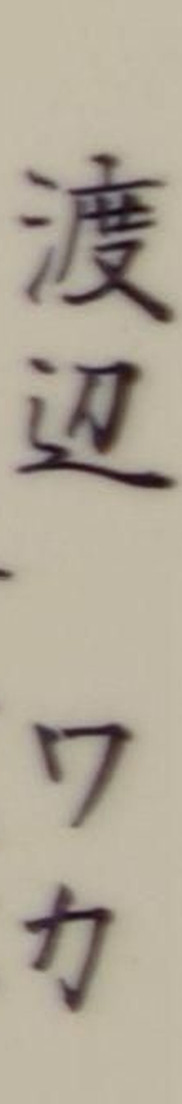渡辺ワカ
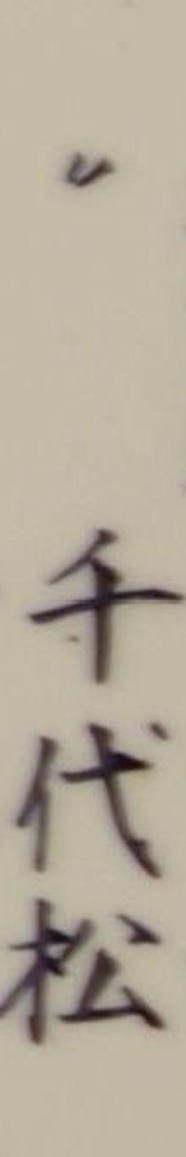千代松
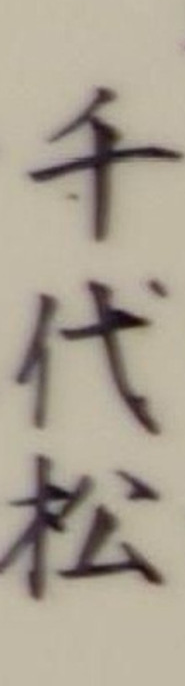千代松
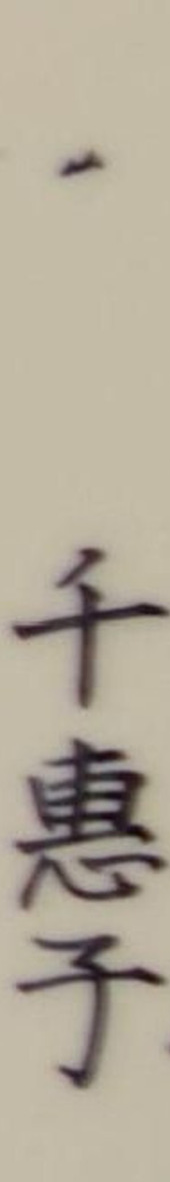千恵子
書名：E~L
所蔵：高野山金剛峯寺
